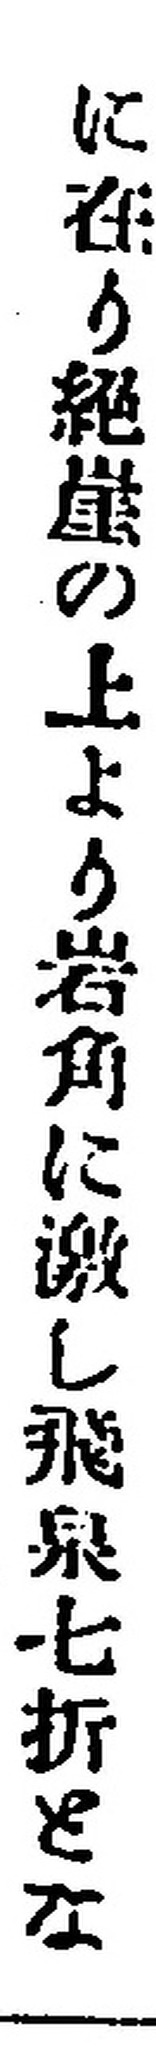に在り絶崖の上より岩角に激し飛泉七折とな
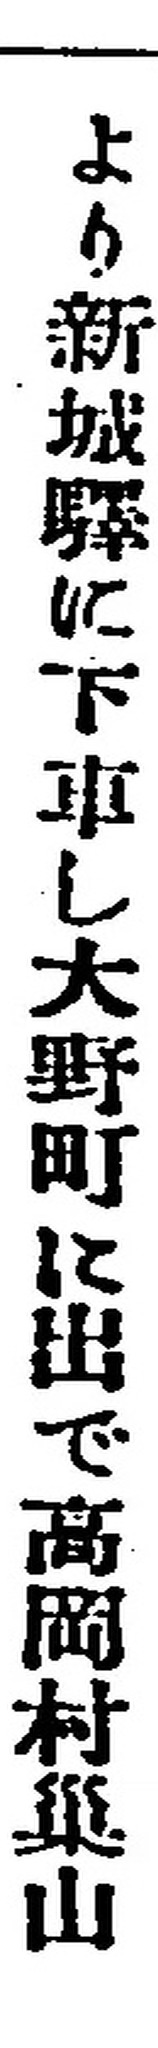より新城駅に下車し大野町に出で高岡村巣山
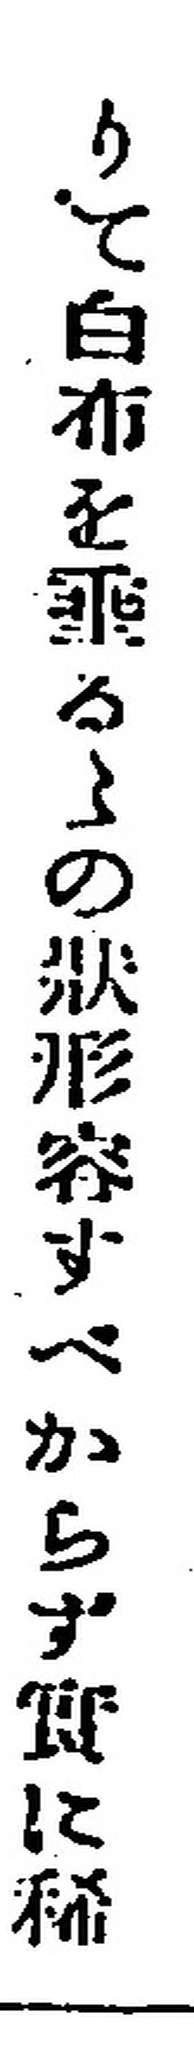りて白布を垂るゝの状形容すべからず実に稀
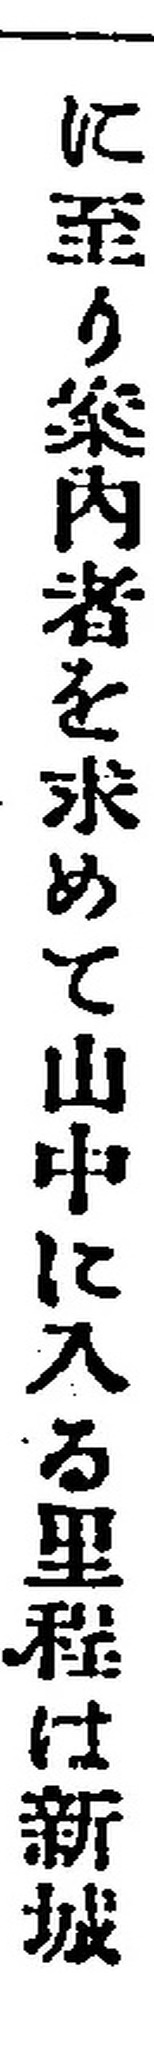に至り案内者を求めて山中に入る里程は新城
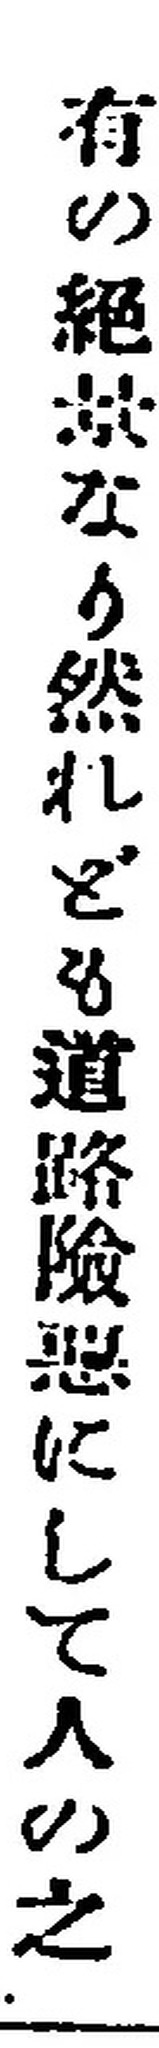有の絶景なり然れども道路険悪にして人の之
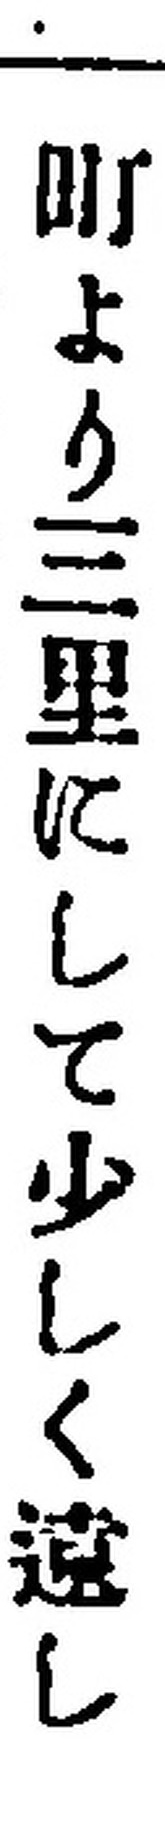町より三里にして少しく遠し
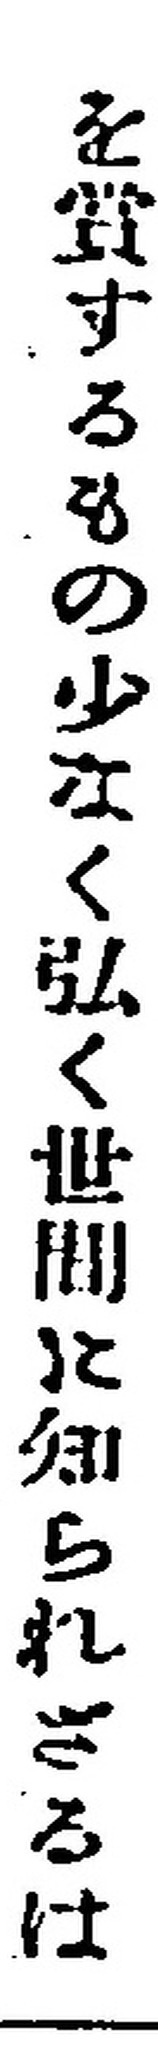を賞するもの少なく弘く世間に知られざるは
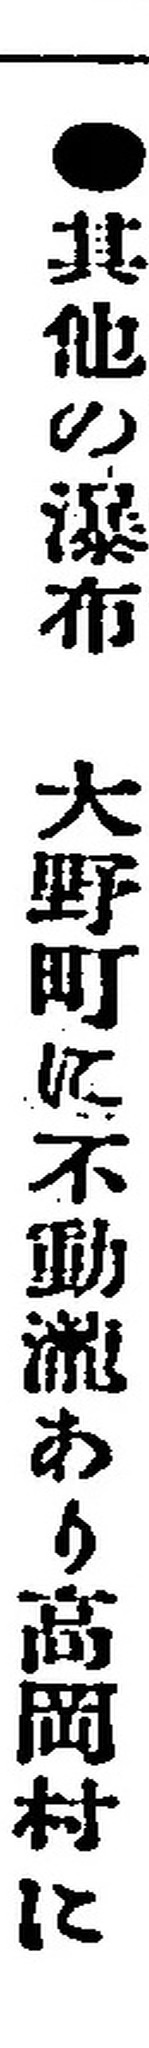●其他の瀑布大野町に不動瀧あり高岡村に
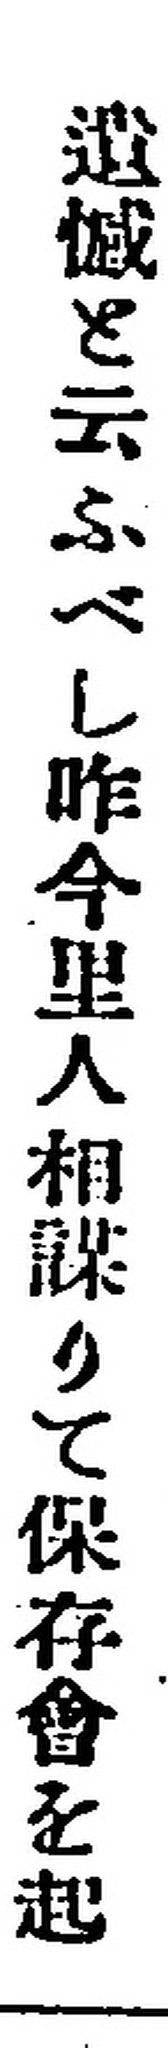遺憾と云ふべし昨今里人相謀りて保存会を起
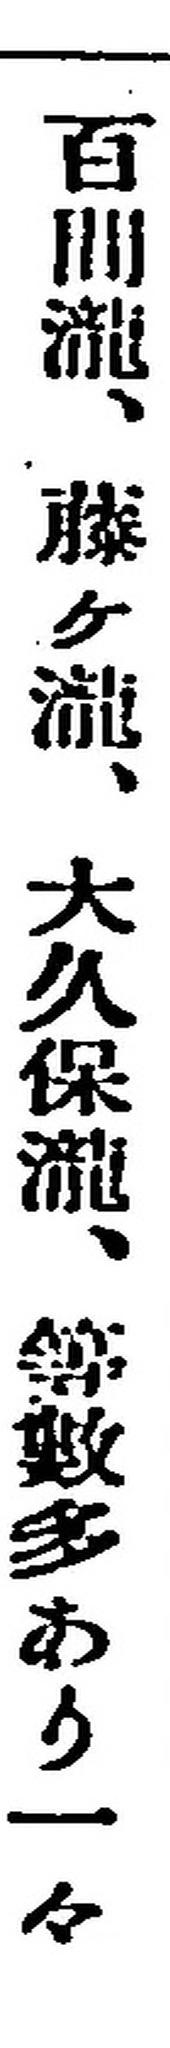百間瀧、藤ヶ瀧、大久保瀧、等数多あり一々
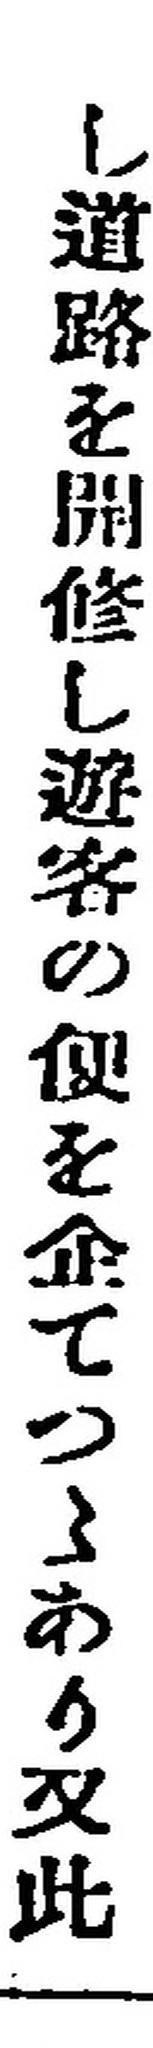し道路を開修し遊客の便を企てつゝあり又此
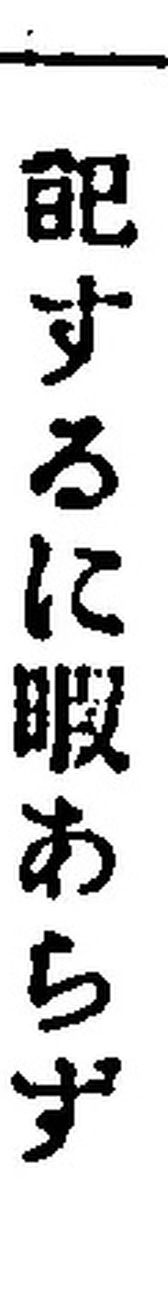記するに暇あらず
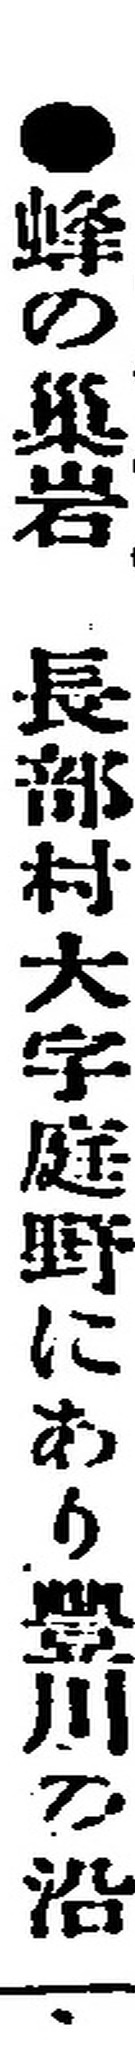●蜂の巣岩長部村大字庭野にあり豊川の沿
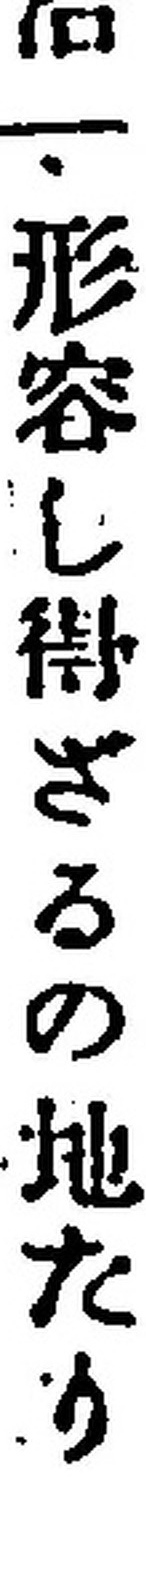形容し得ざるの地たり
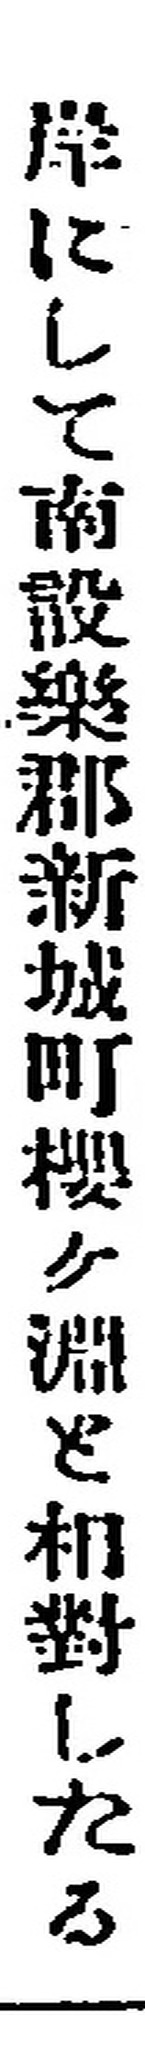岸にして南設楽郡新城町桜ヶ淵と相対したる
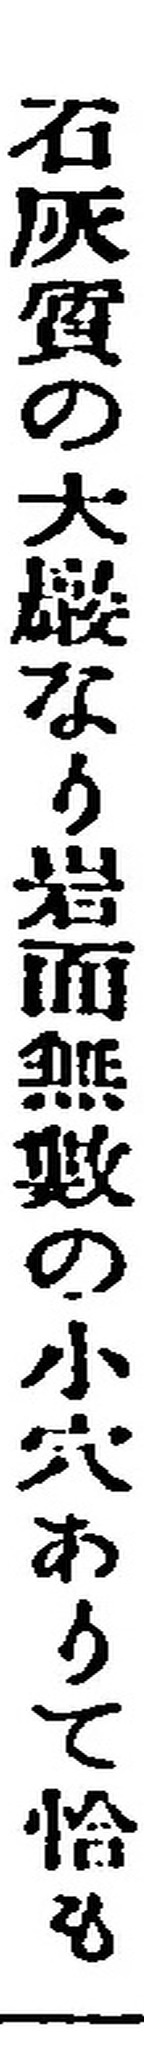石灰質の大巌なり岩面無数の小穴ありて恰も
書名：東参名勝案内
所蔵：国立国会図書館 National Diet Library, JAPAN
